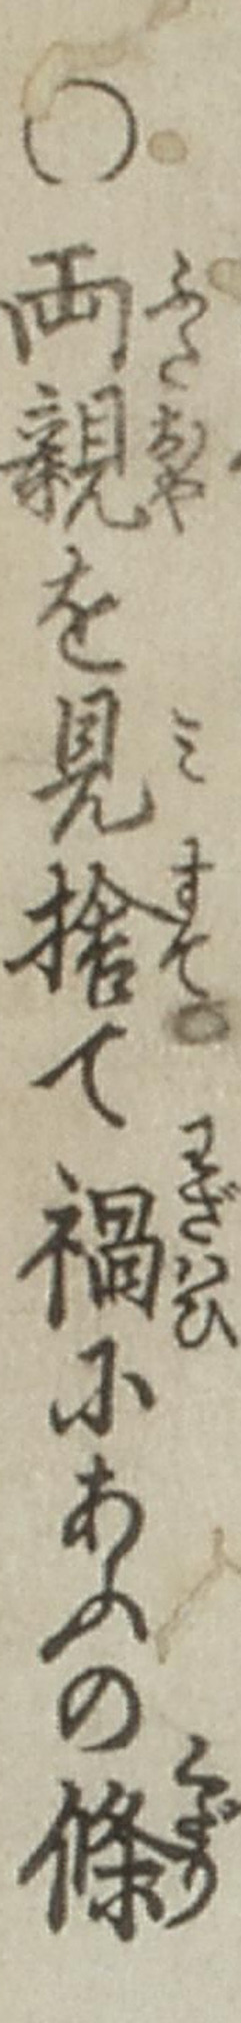○両親を見捨て禍にあふの条
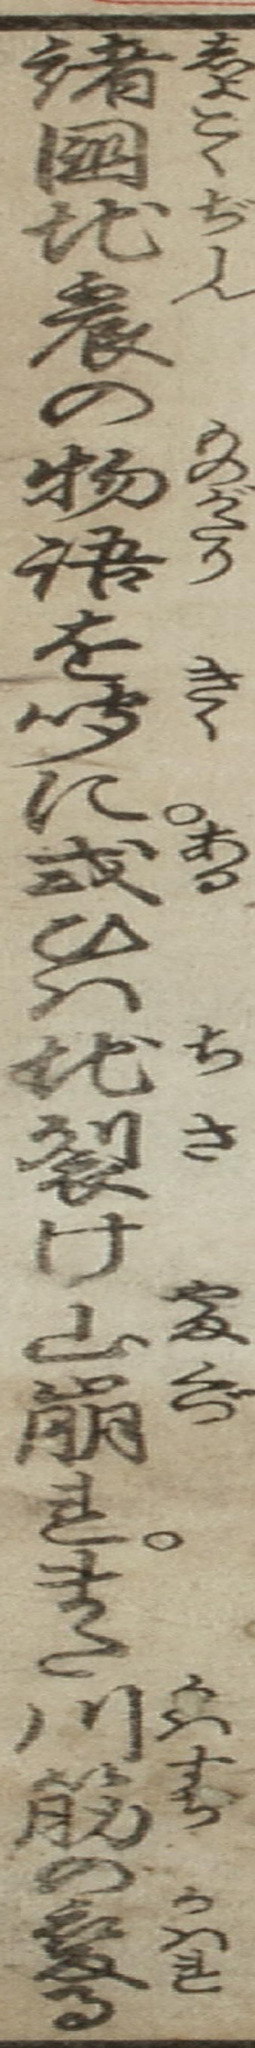諸国地震の物語を聞くに。或ひは地裂け山崩れ。また川筋の変る
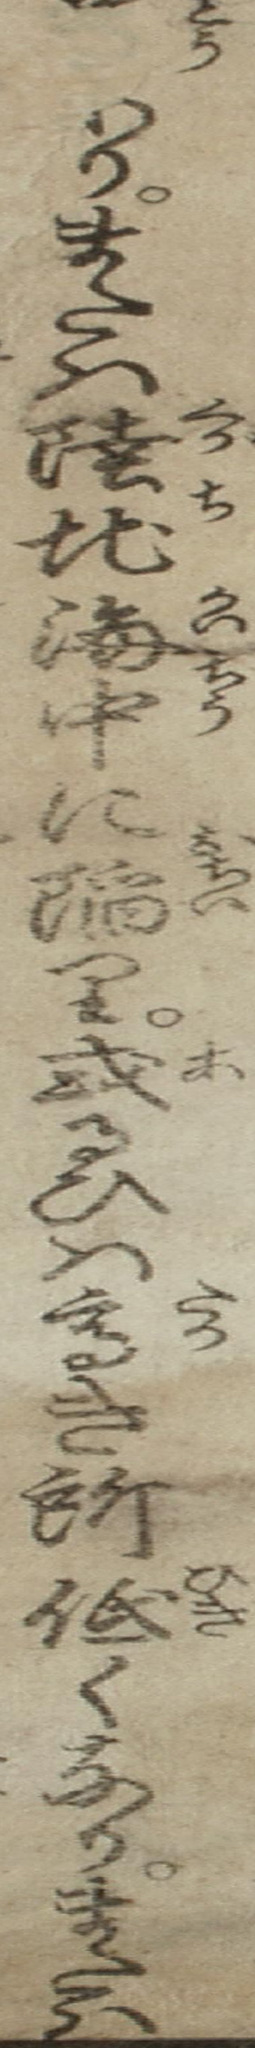等あり。または陸地海中に陥り。或るひは高き所低くなり。または
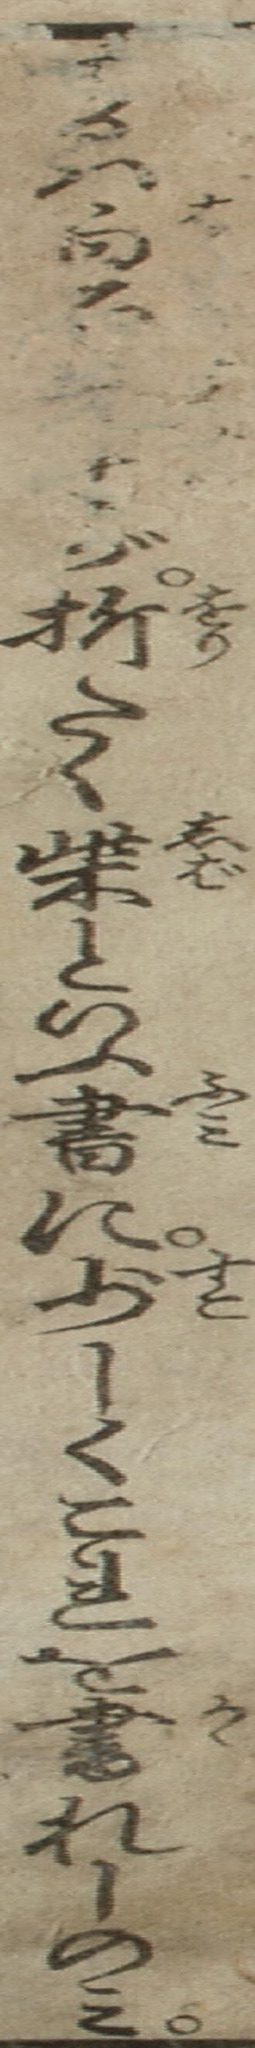せるは白石先生が。折たく柴といふ書に。少しくこれを書れしのみ。
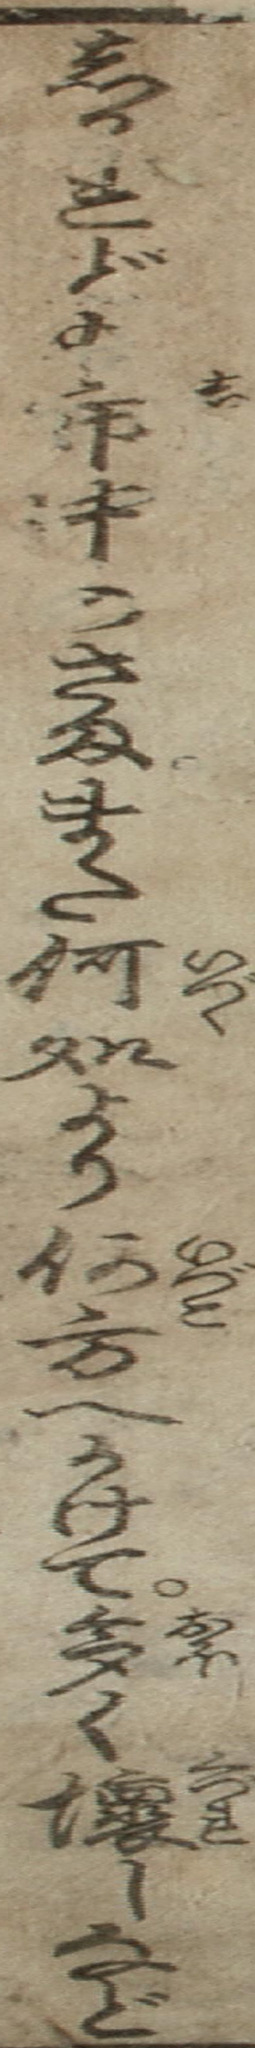しかれども市中のさま。また何処より。何方へかけて。多く壊しなど
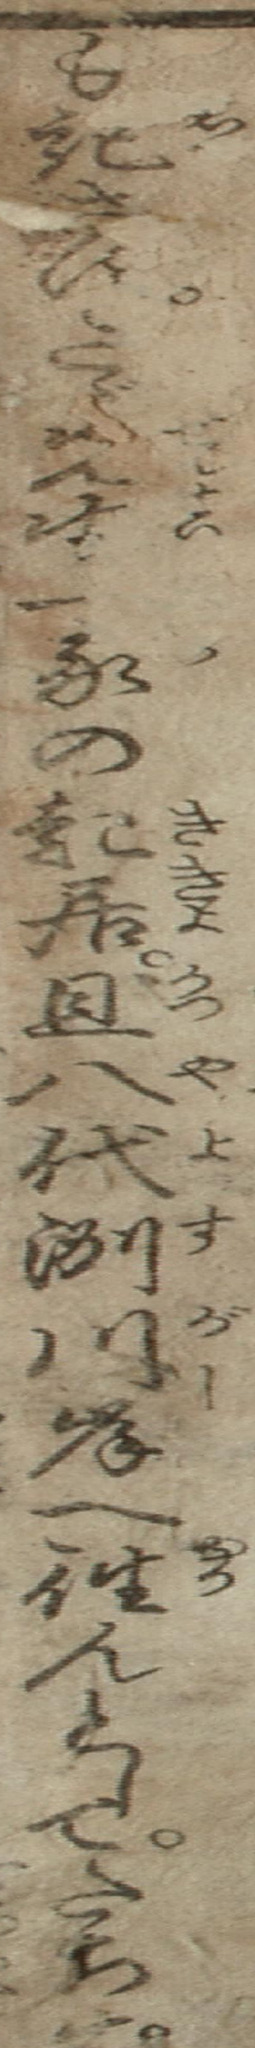も記さず。たゞ先生一家の起居。八代洲川岸へ往んとして。たち出
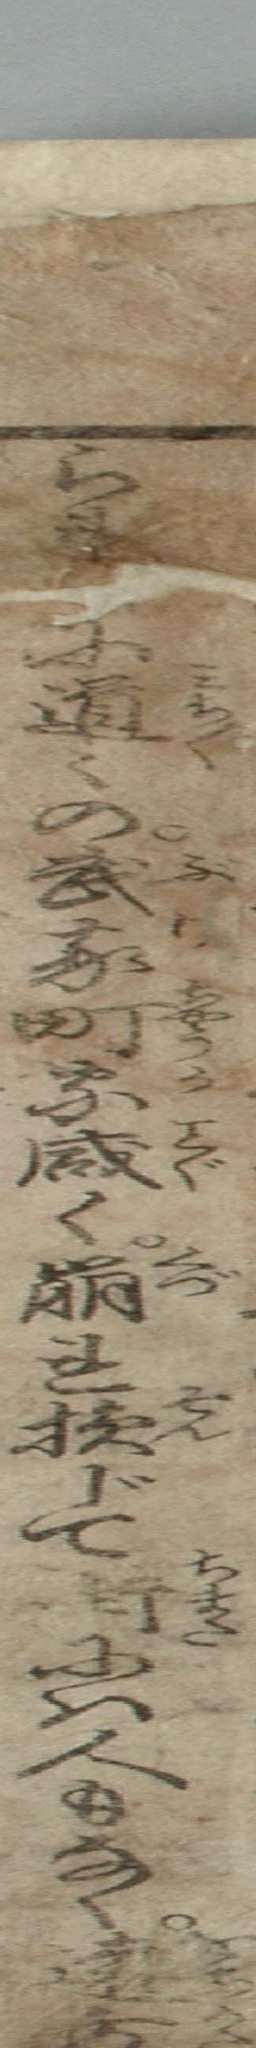られしに道〻の。武家町家咸く。崩れ損じて街には人もなく。遠方に

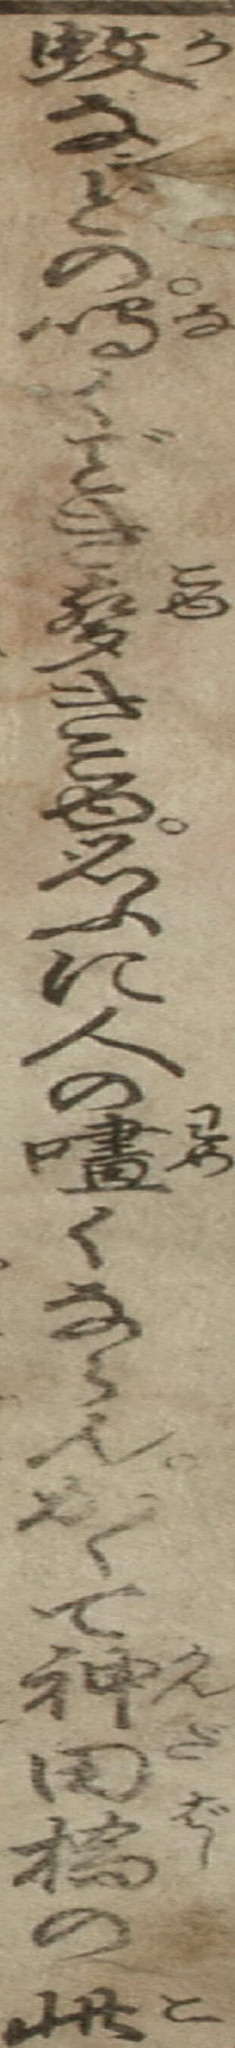蚊などの。鳴くごとき声きこゆ。思ふに人の㗲わめくならん。かくて神田橋の此
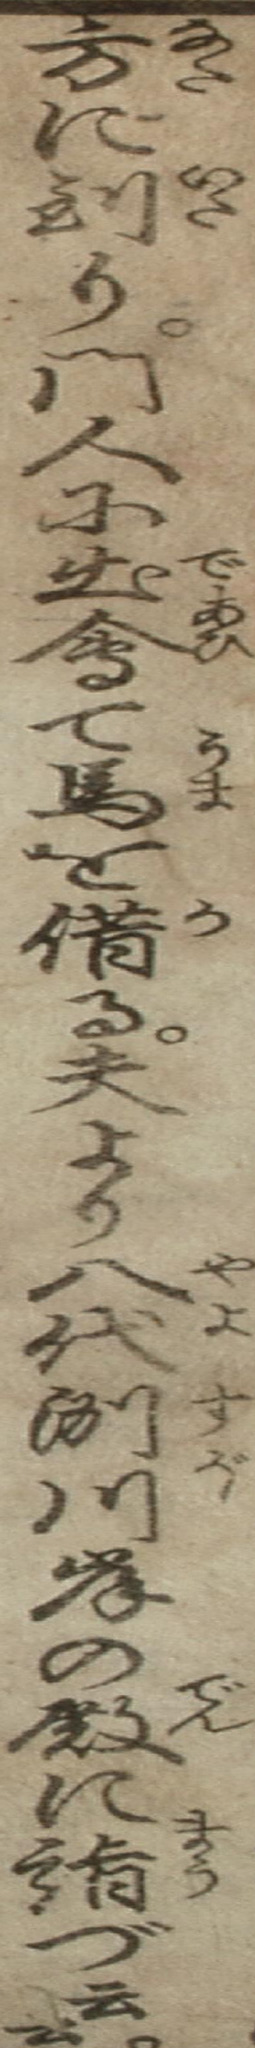方に到り。門人に出会て馬を借る。夫より八代洲川岸の殿に詣づ云云。
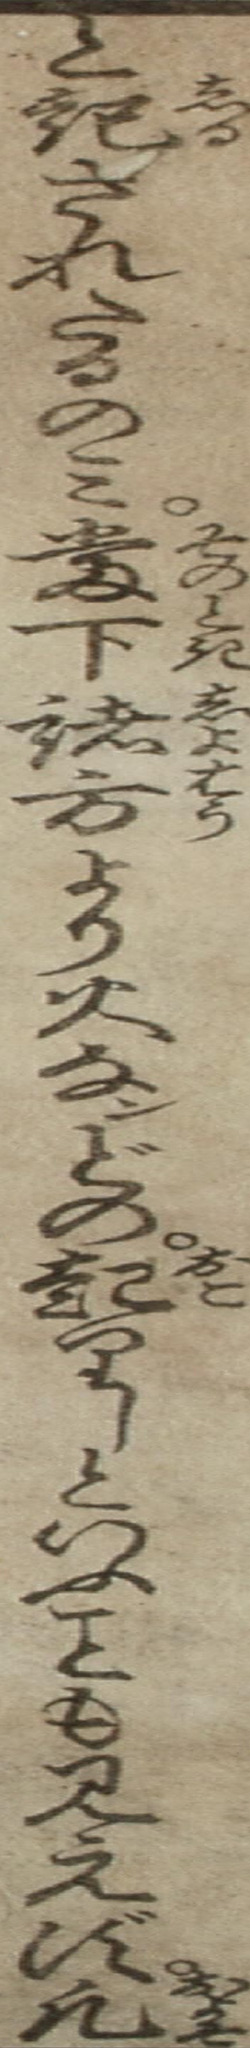と記されたるのみ。当下諸方より火なンどの。起りしといふことも見えず。凡
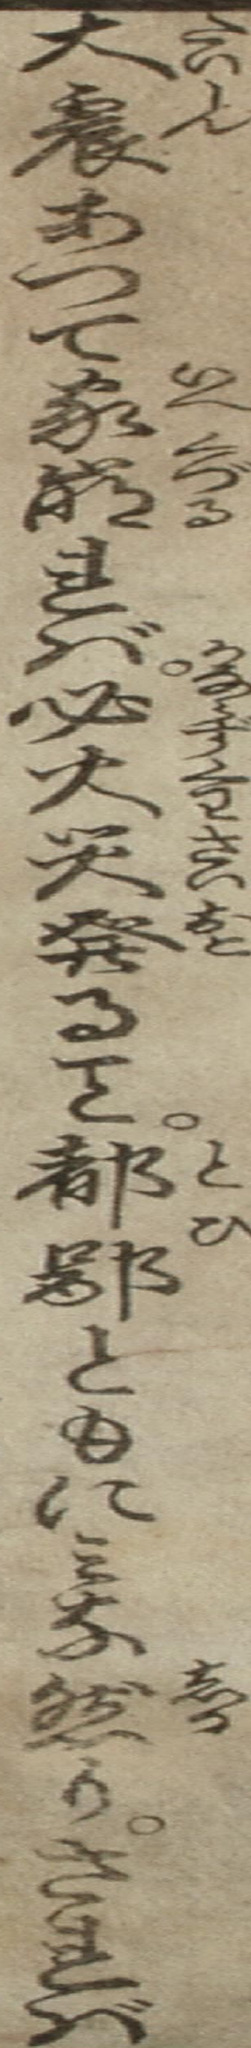大震あつて家崩れば。必火災発ること。都鄙ともにみな然り。されば
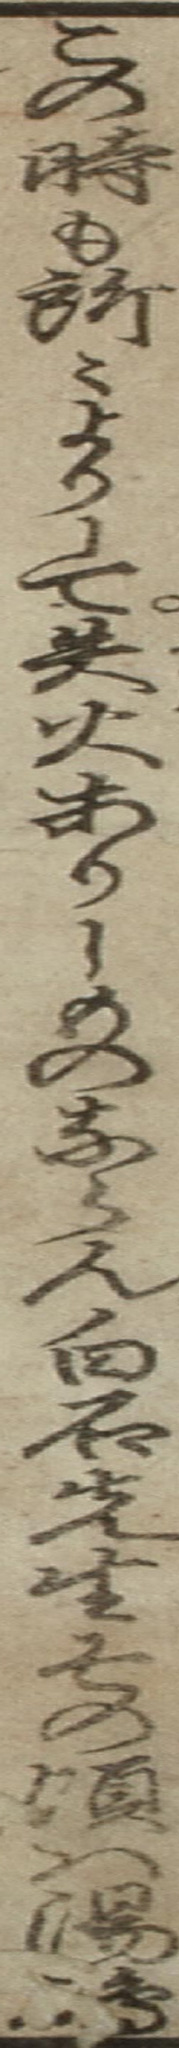この時も所〻よりして。失火ありしものならん。白石先生その頃は湯島
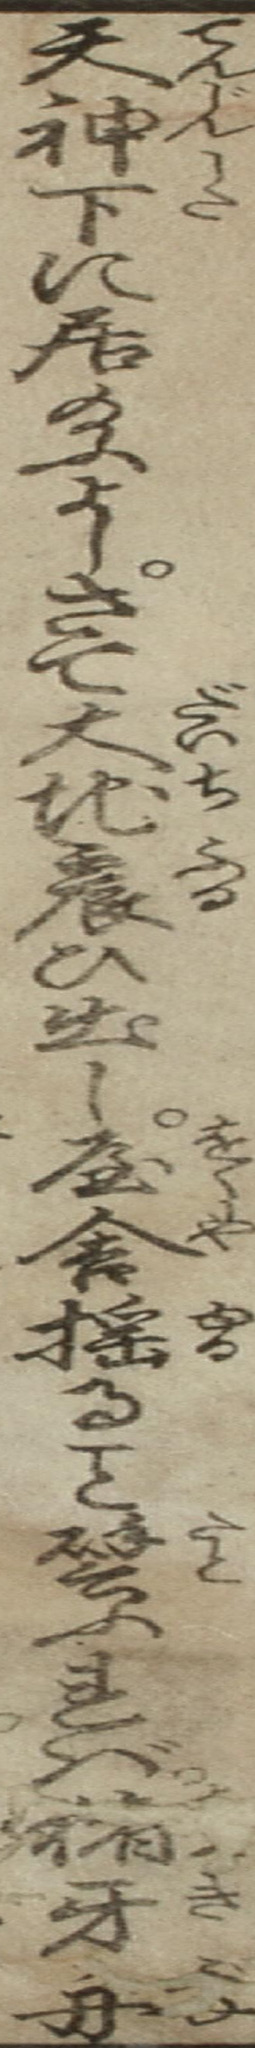天神下に居給ふよし。さて大地震ひ出し。屋舎揺ること譬ふれば。猪牙舟
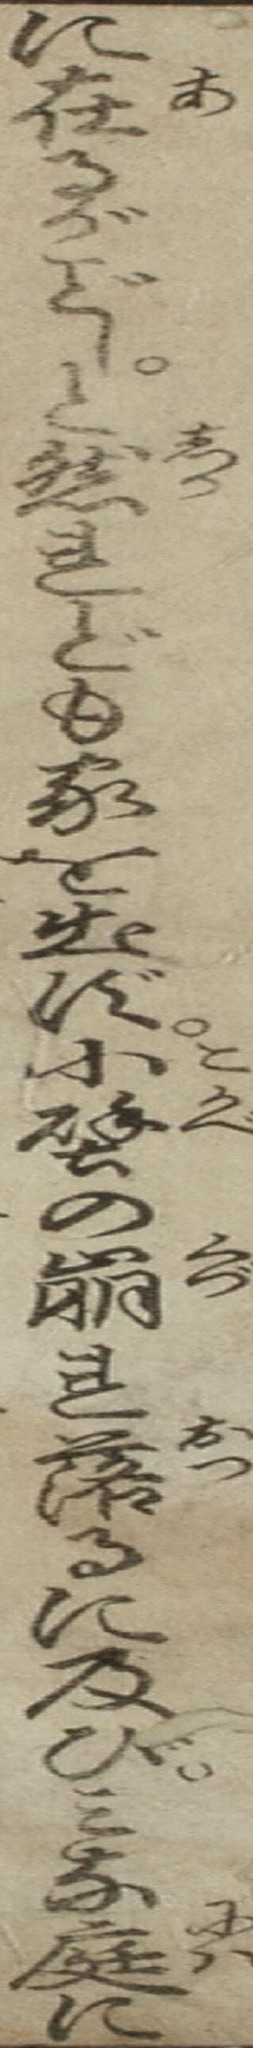に在るがごとし。と然れども家を出ず。小壁の崩れ落るに及び。みな庭に
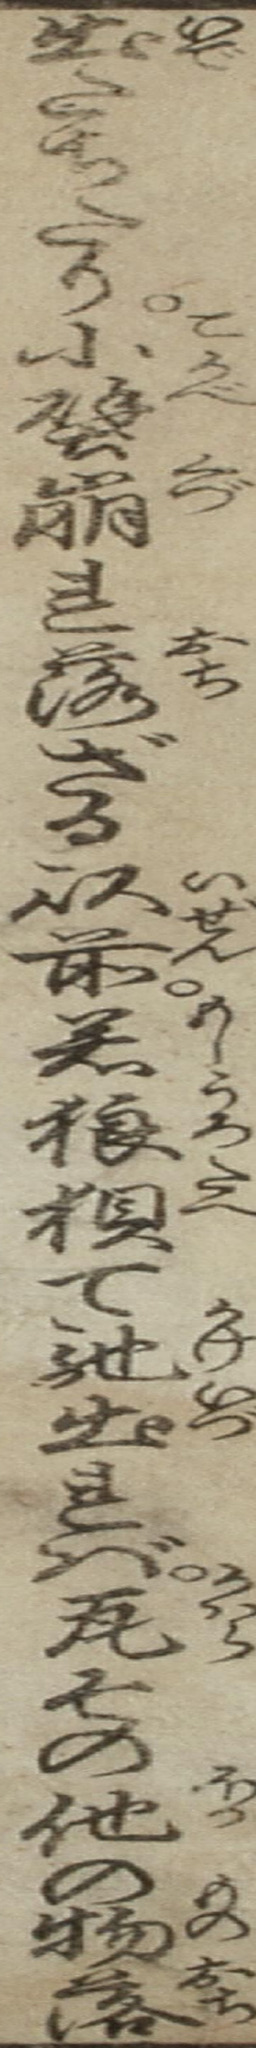出たちたり。小壁崩れ落ざる以前。若狼狽て馳出れば。瓦その他の物落
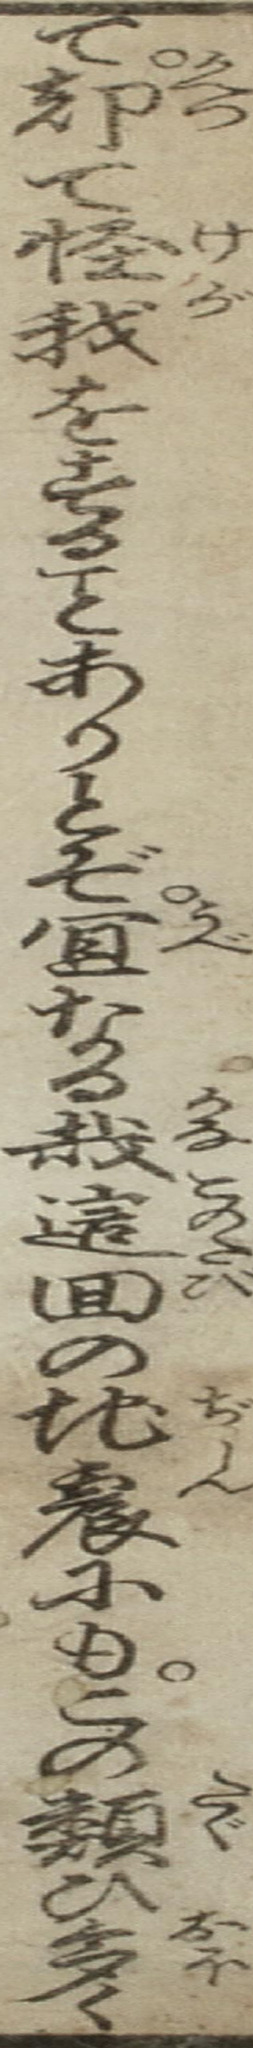て。却て怪我をすることありとぞ。冝なる哉這回の地震にも。この類ひ多く
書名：安政見聞録　中
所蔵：東京大学地震研究所図書室 Earthquake Research Institute Library, The University of Tokyo, JAPAN
